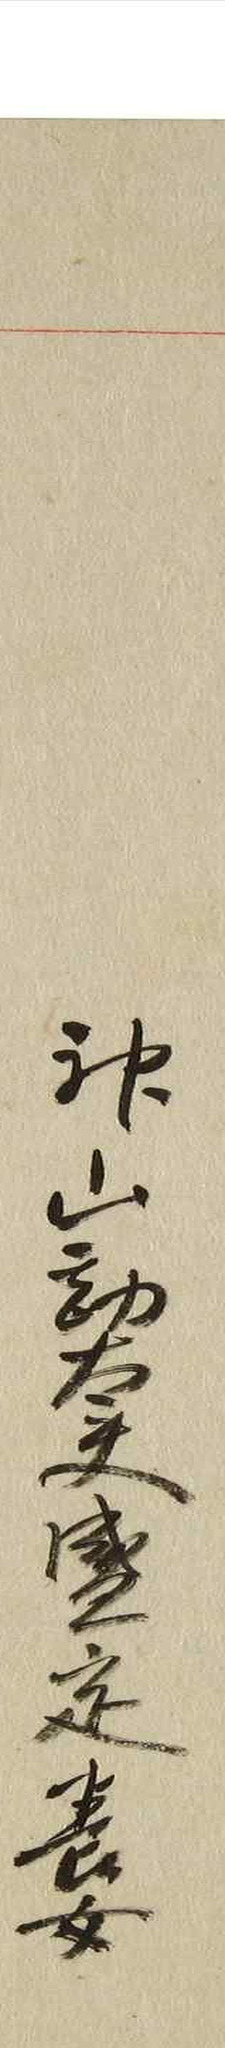神山勘太夫盛定養女
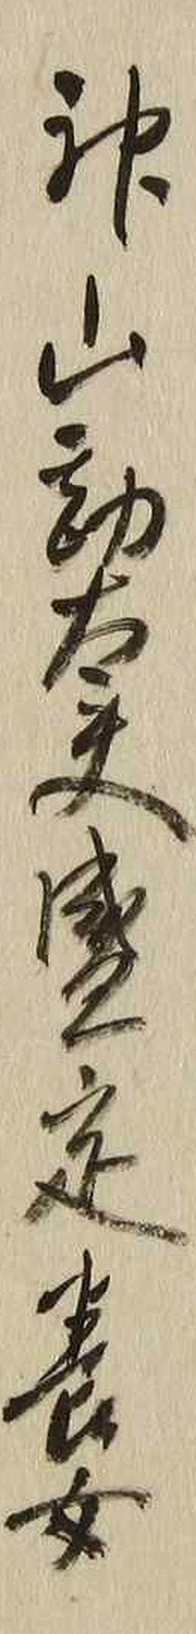神山勘太夫盛定養女
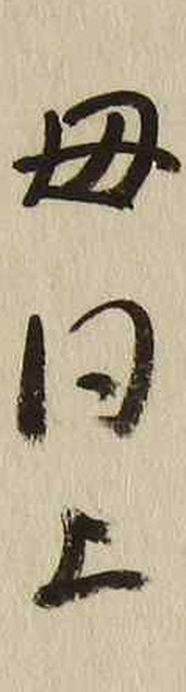母同上
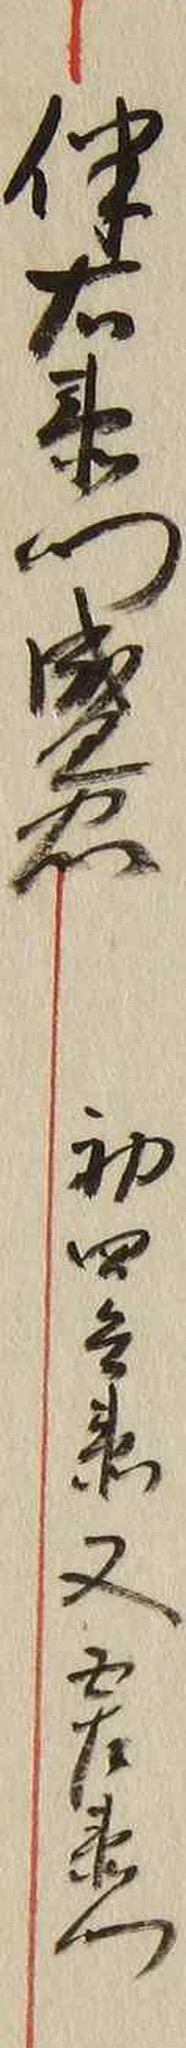伊右衛門盛忠初四兵衛又五左衛門
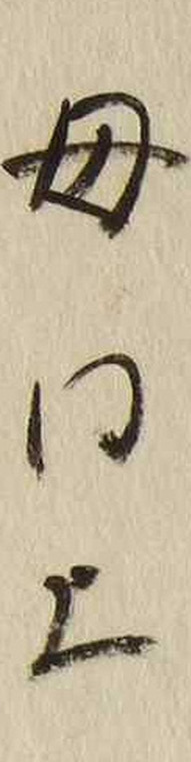母同上

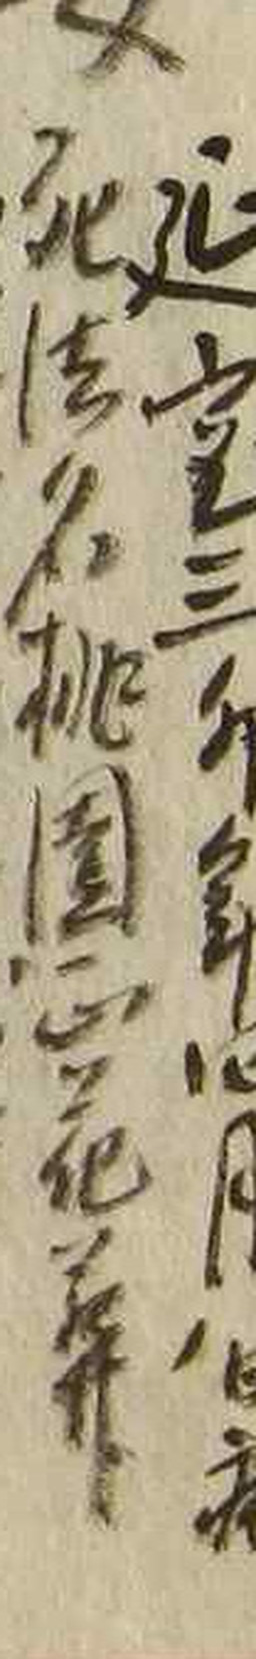死法名桃園正花葬
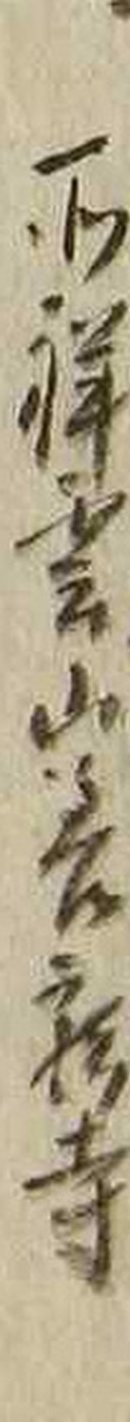所祥雲山善龍寺
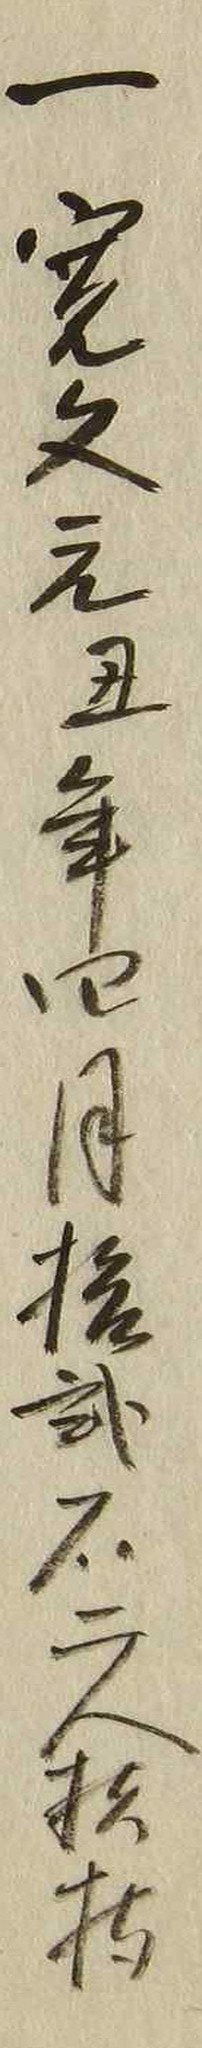一寛文元丑年四月拾弐石二人扶持
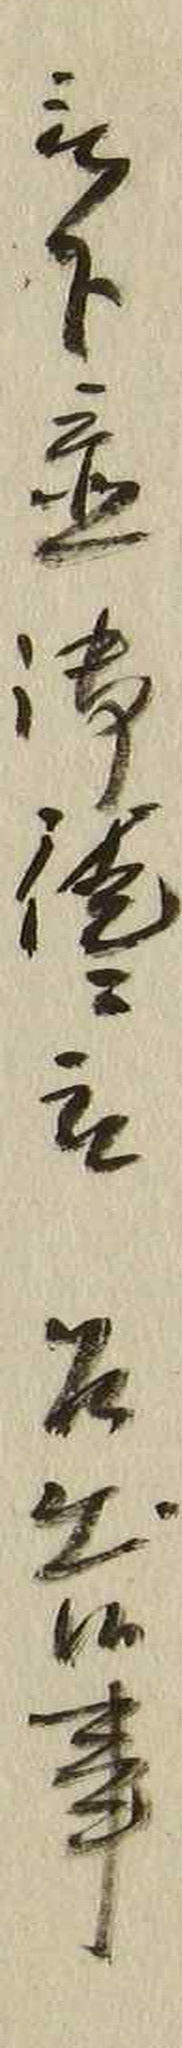被下置御徒に被召出候事
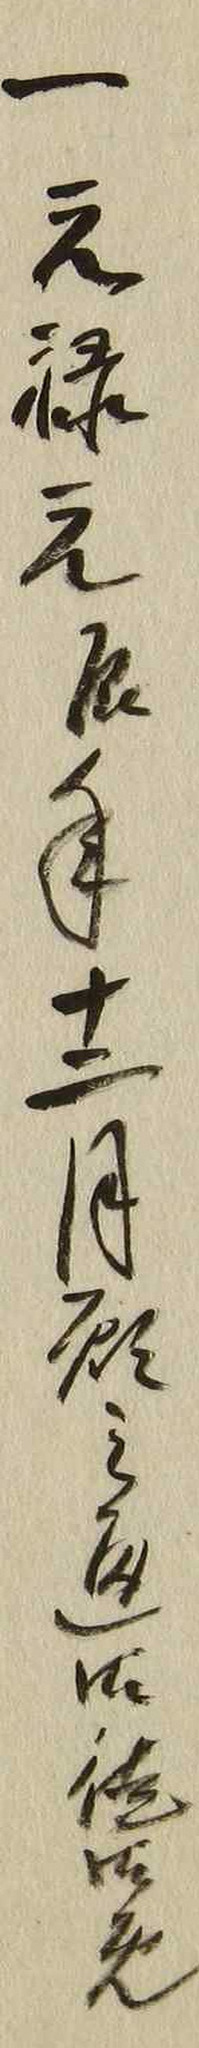一元禄元辰年十二月願之通御徒御免
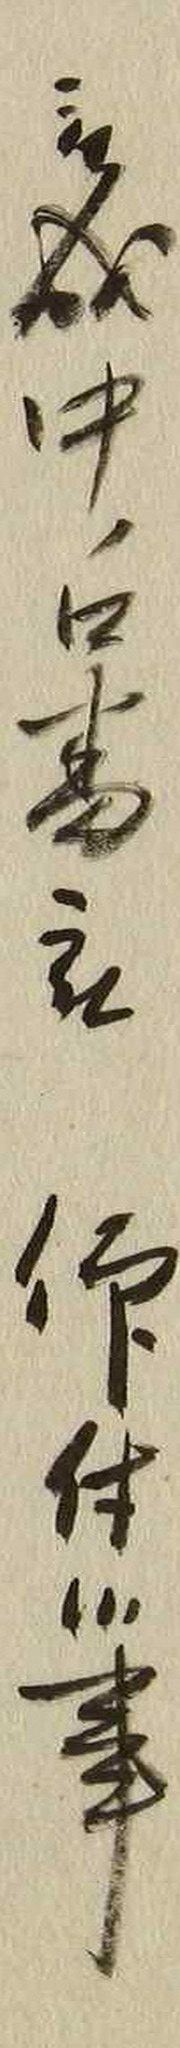被成中ノ口番被仰付候事
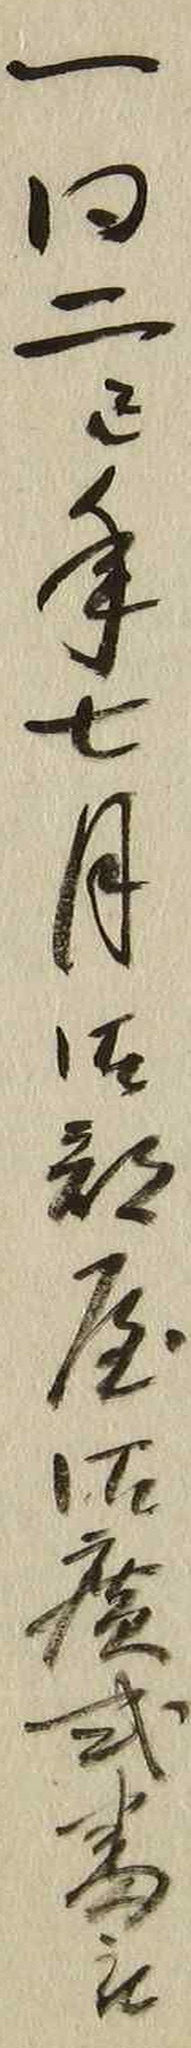一同二巳年七月御部屋御広式番被
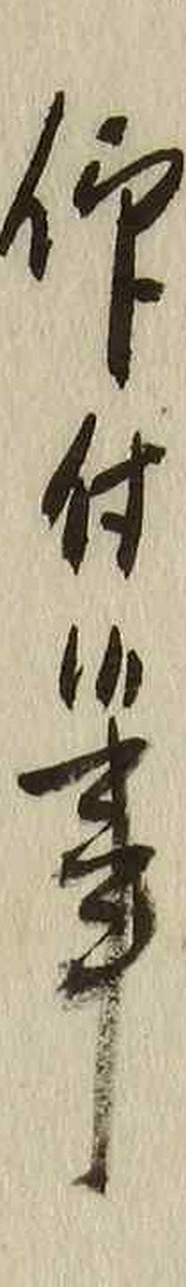仰付候事
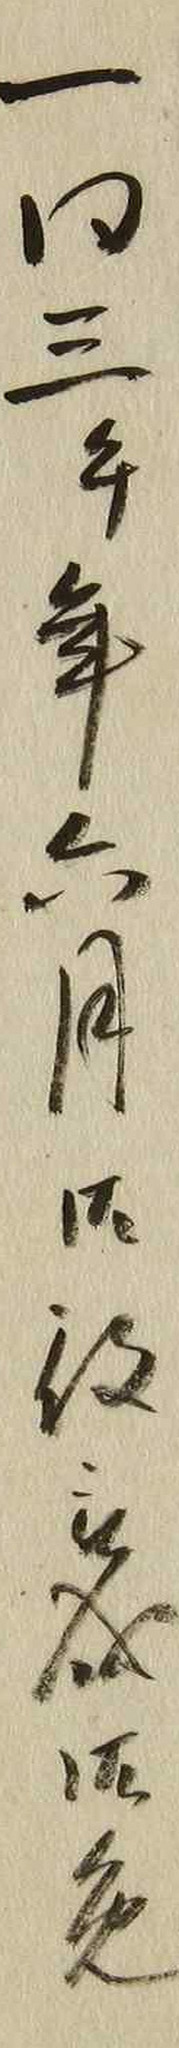一同三午年六月御役被成御免
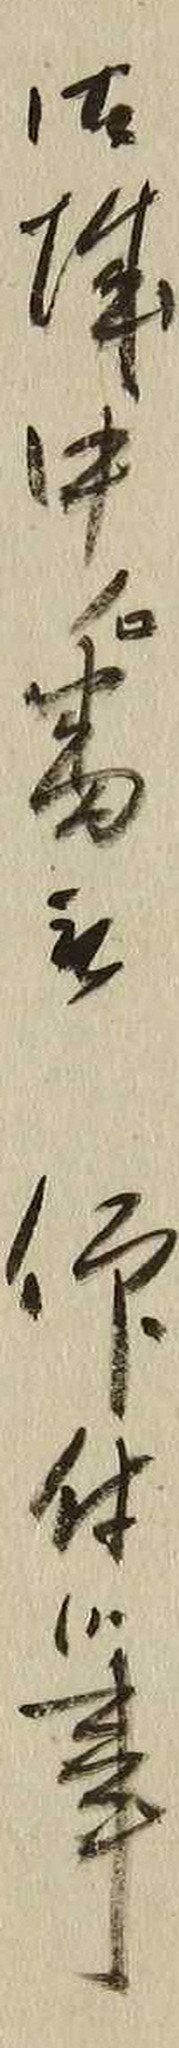御城中ノ口番被仰付候事
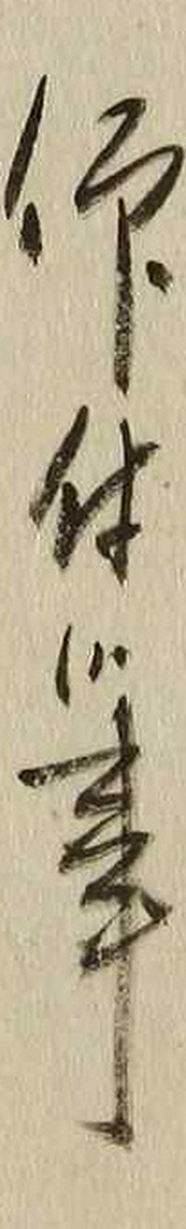仰付候事
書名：諸士系譜　巻之360　す之部10
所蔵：会津若松市立会津図書館
